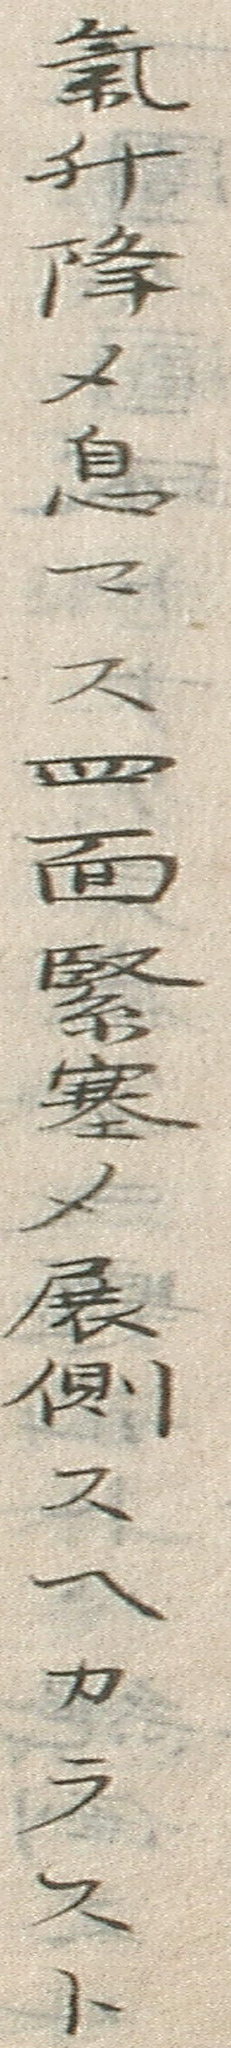気昇降シテ息マス四面緊塞シテ展側スヘカラスト
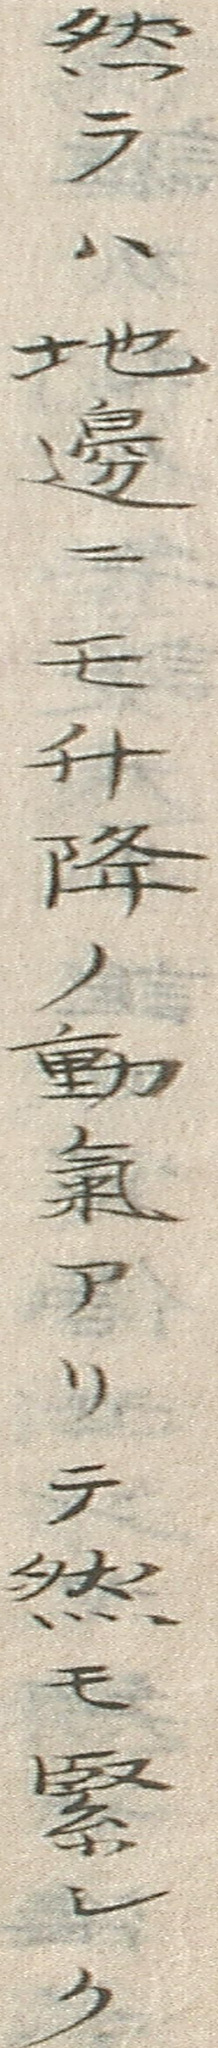然ラハ地辺ニモ昇降ノ動気アリテ然モ緊シク
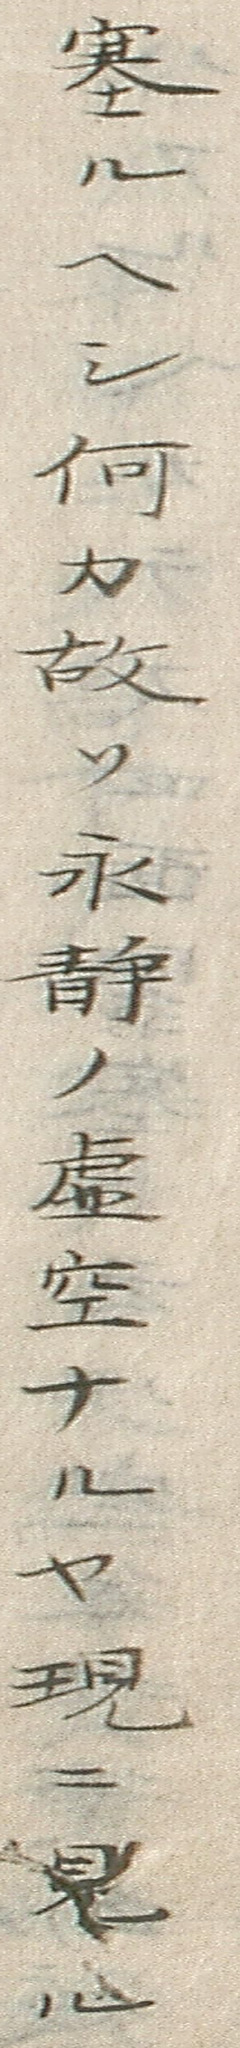塞ルヘシ何カ故ソ永静ノ虚空ナルヤ現ニ見ル
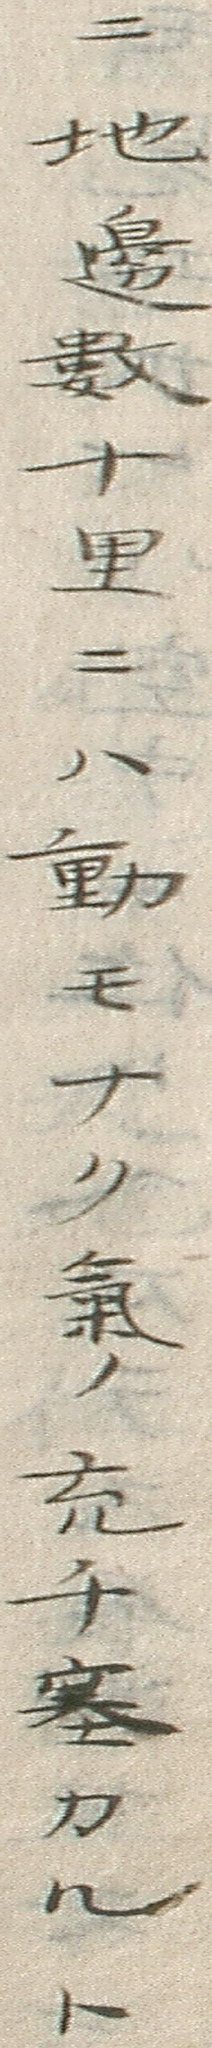ニ地辺数十里ニハ動モナク気ノ充千塞カルト

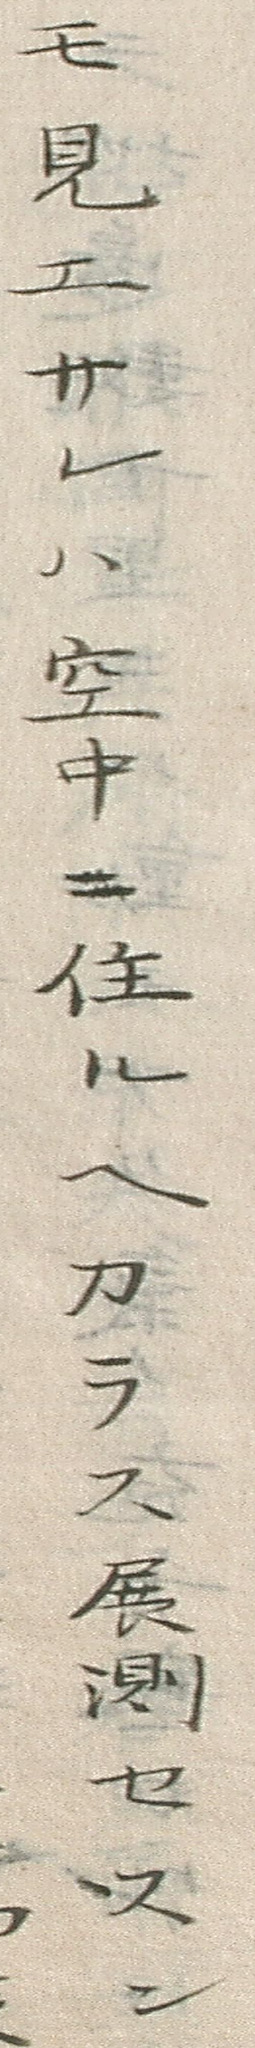モ見エサレハ空中ニ住ルヘカラス展側セスン
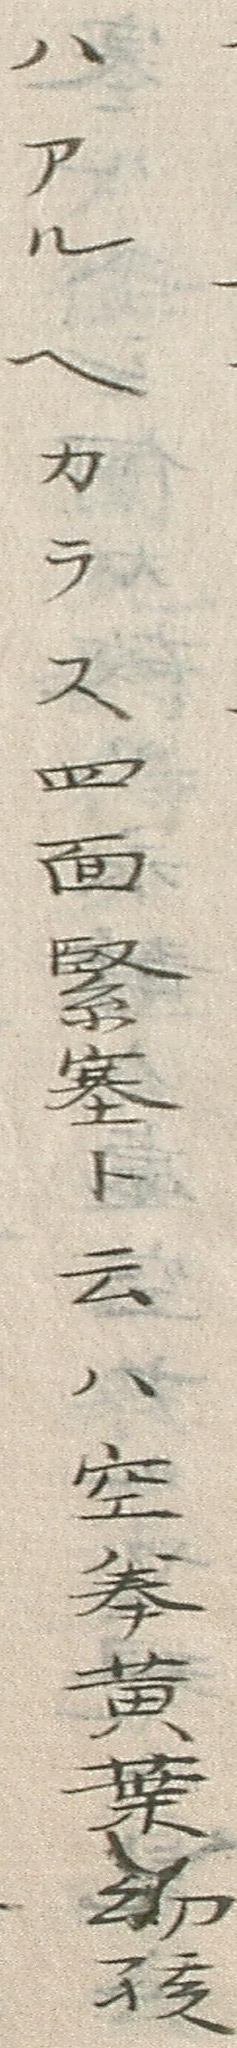ハアルヘカラス四面緊塞ト云ハ空拳黄葉幼稜
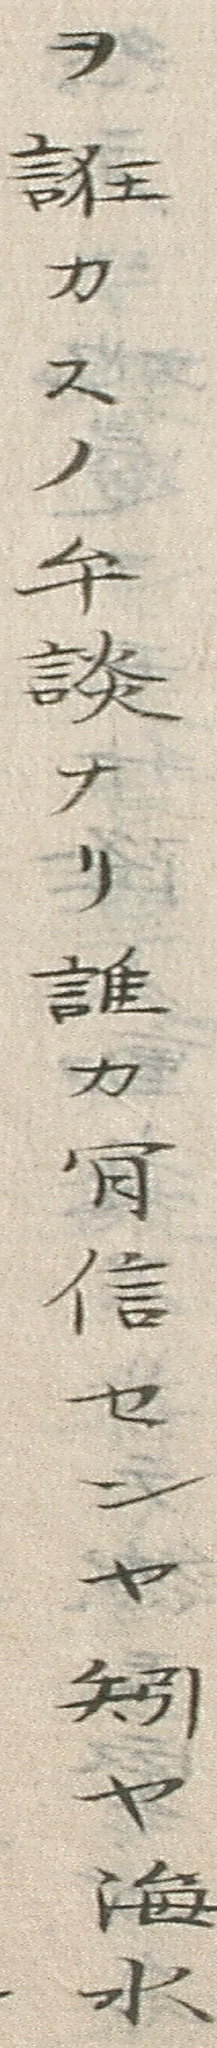ヲ誑カスノ余談ナリ誰カ盲信センヤ矧ヤ海水
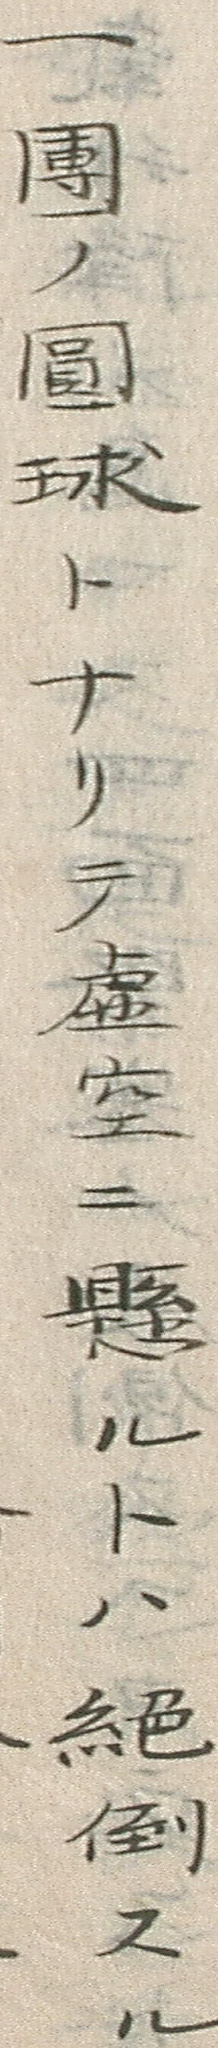一団ノ円球トナリテ虚空ニ懸ルトハ絶倒スル
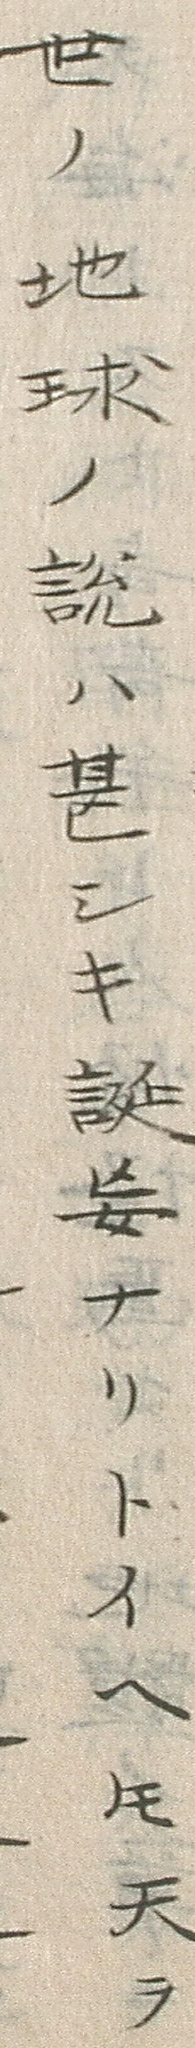世ノ地球ノ説ハ甚シキ誕妄ナリトイヘトモ天ヲ
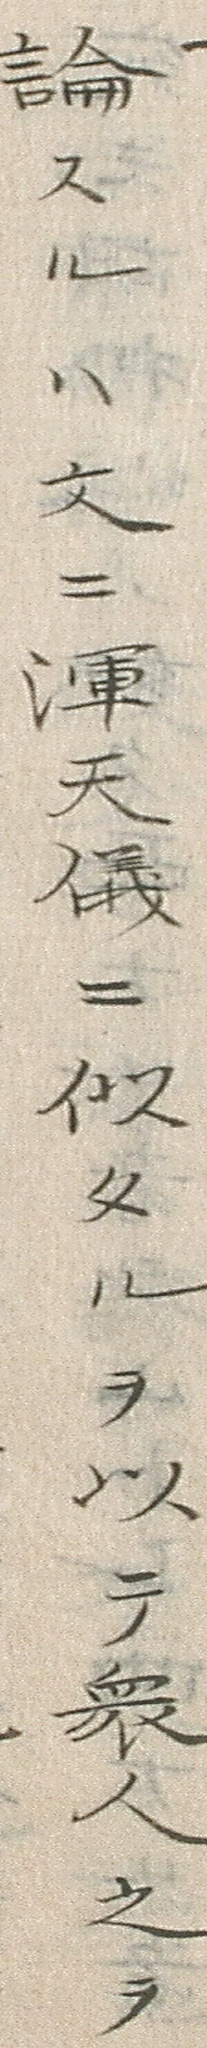論スルハ文ニ渾天儀ニ似タルヲ以テ衆人之ヲ
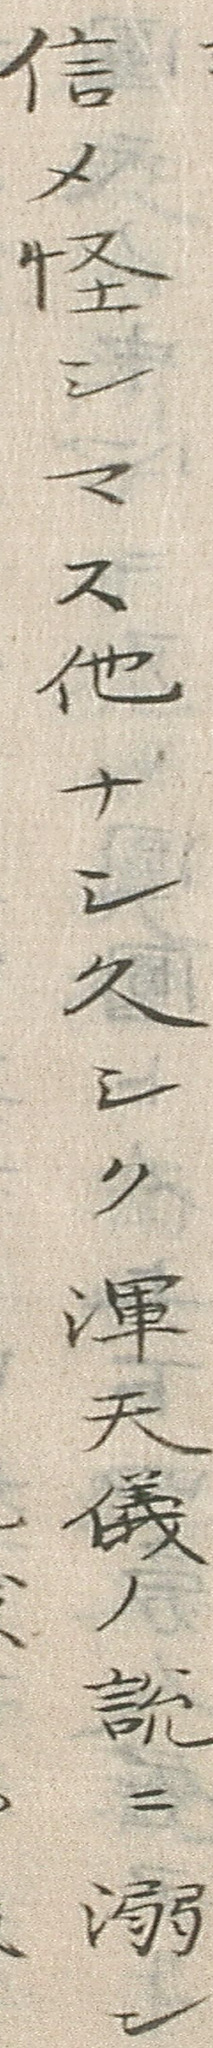信シテ怪シマス他ナシ久シク渾天儀ノ説ニ溺シ
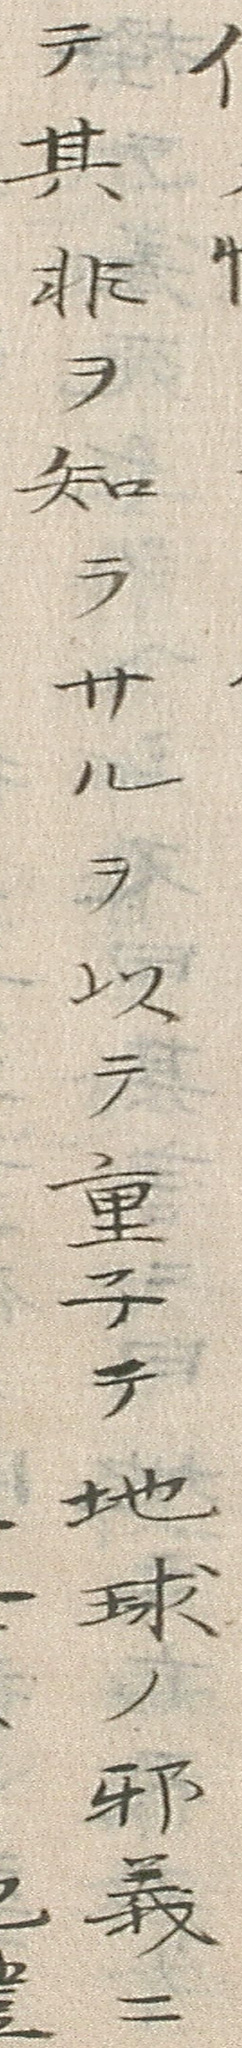テ其非ヲ知ラサルヲ以テ重ネテ地球ノ邪義ニ
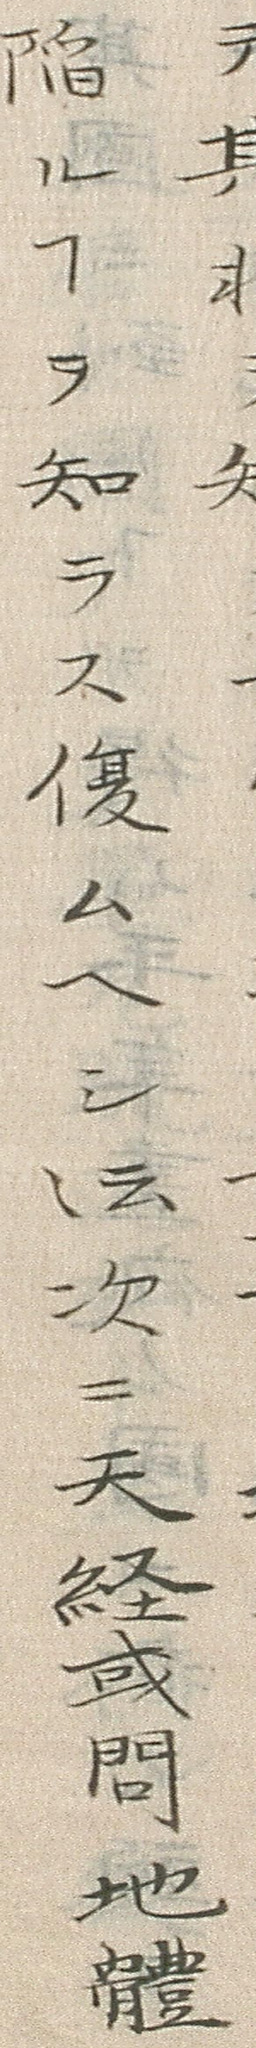陥ルコトヲ知ラス傷ムヘシ云〻次ニ天経或問地体
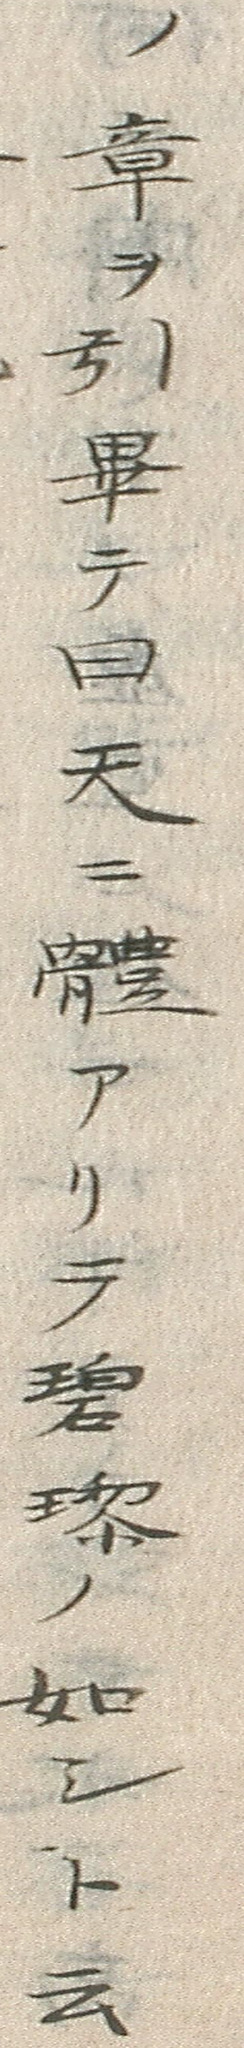ノ章ヲ引畢テ曰天ニ体アリテ碧瓈ノ如シト云
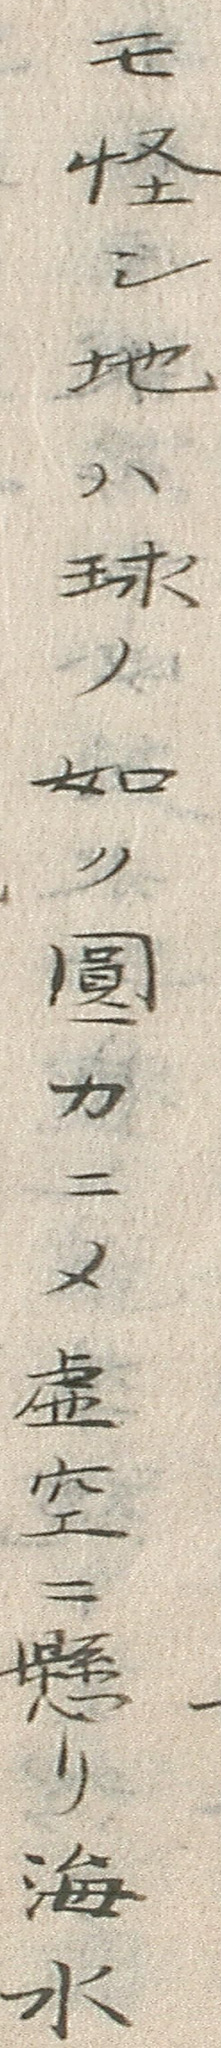モ怪シ地ハ球ノ如ク円カニシテ虚空ニ懸リ海水
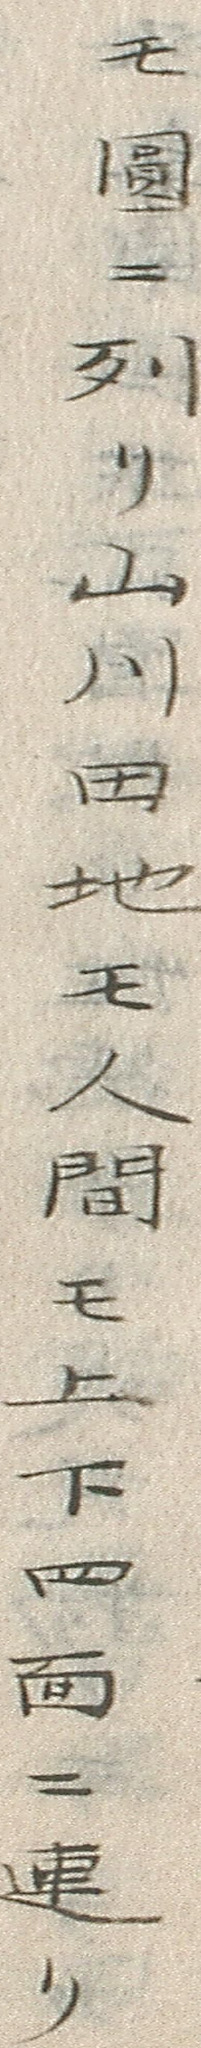モ円ニ列リ山川田地モ人間モ上下四面ニ連リ
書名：天學略名目羽翼　全
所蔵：東京大学地震研究所図書室 Earthquake Research Institute Library, The University of Tokyo, JAPAN
